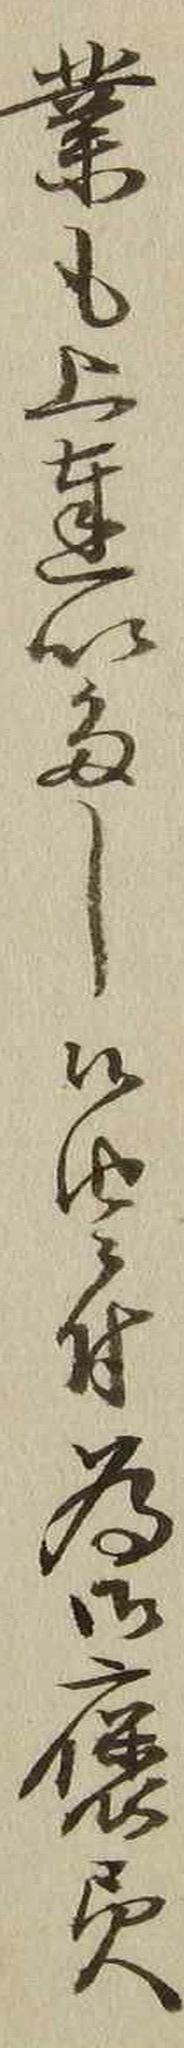業も上達いたし候由ニ付為御褒美
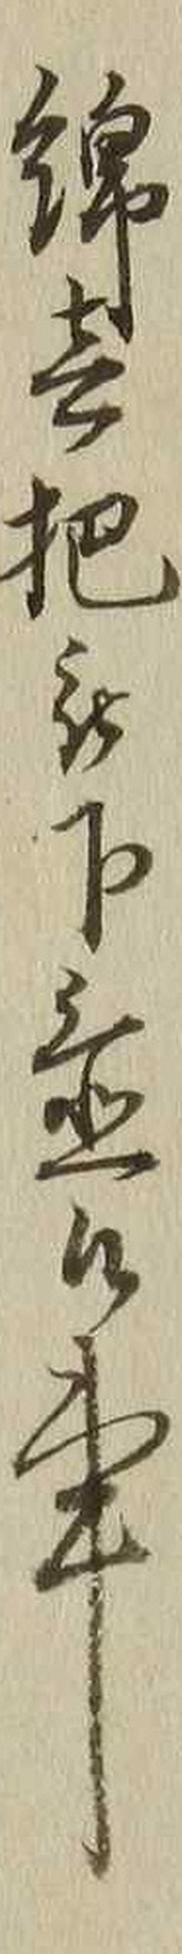綿壱把被下興置候事
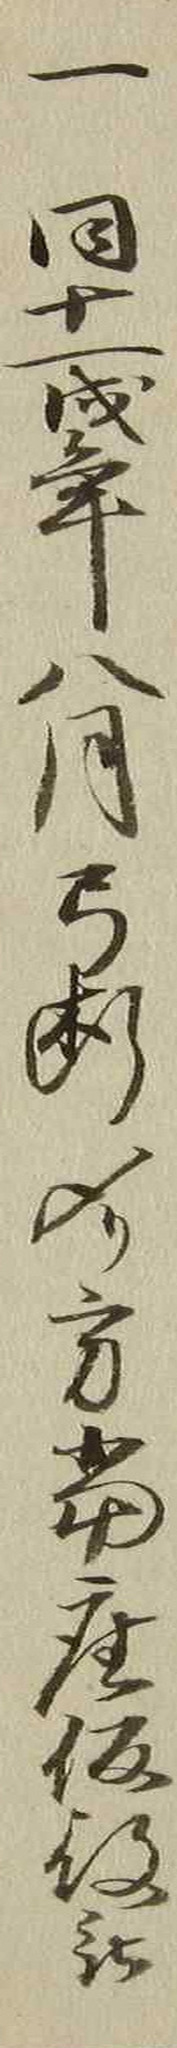一同十一戌年八月弓術〆リ方当座仮役被
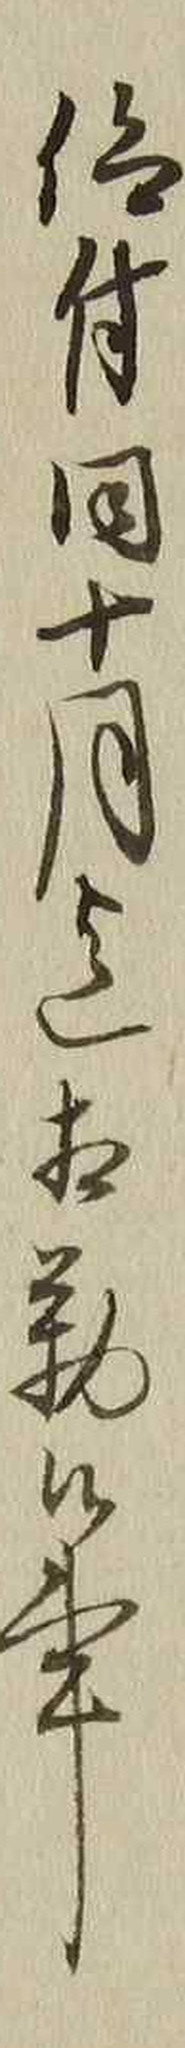仰付同十月迄相勤候事
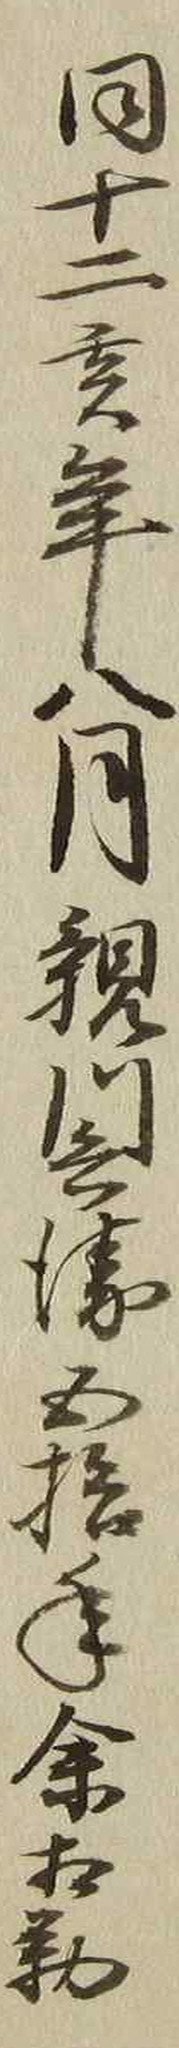一同十二亥年八月親川兵衛五拾年余相勤
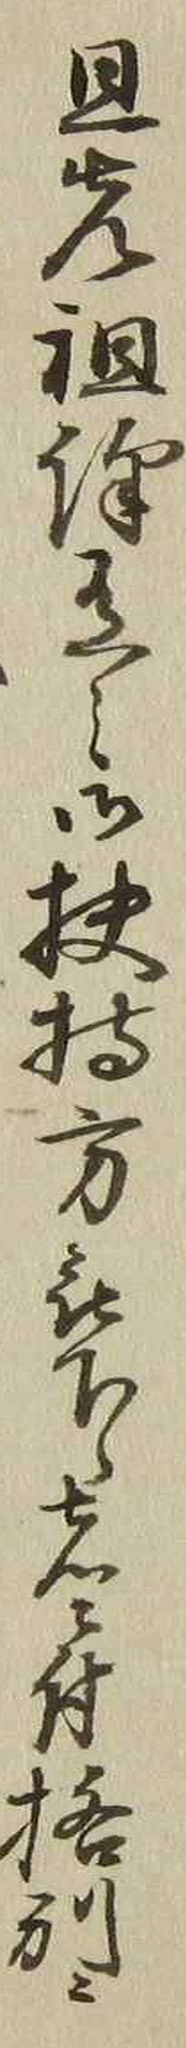且先祖訳有之御扶持方被下候者ニ付格別ニ
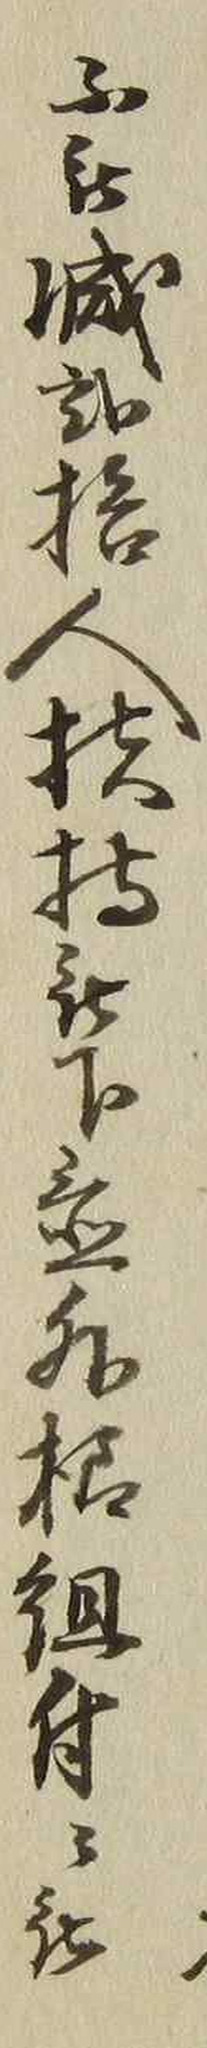ふ被減弐拾人扶持被下置外様組付ニ被
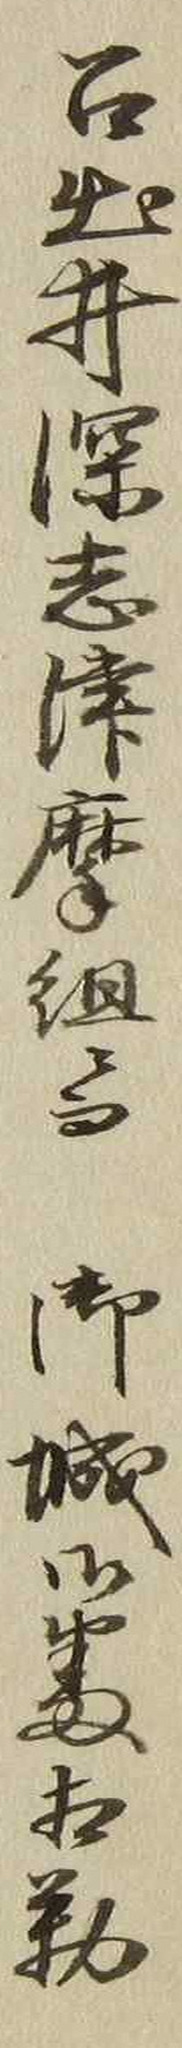召出井深志津摩組ニ而御城御番相勤
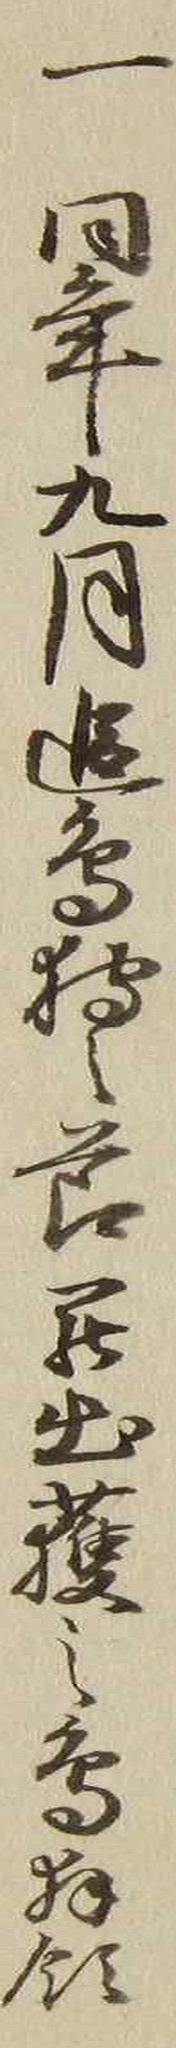一同年九月追鳥狩之節罷出獲之鳥拝領
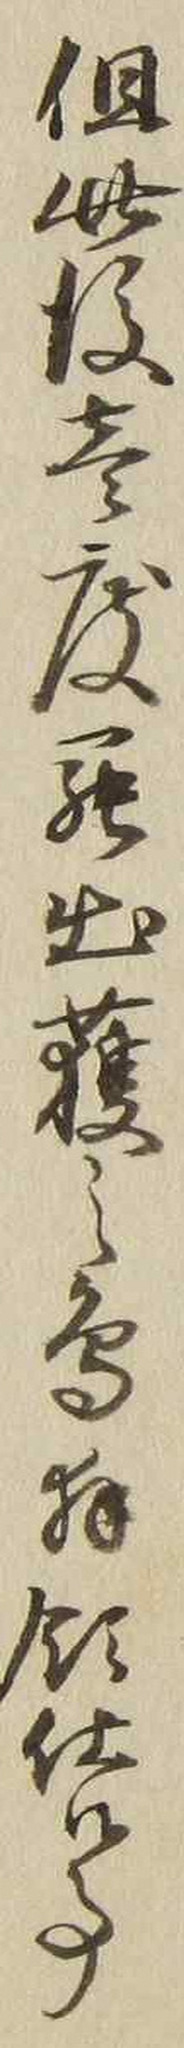但此後壱度罷出獲之鳥拝領仕候事
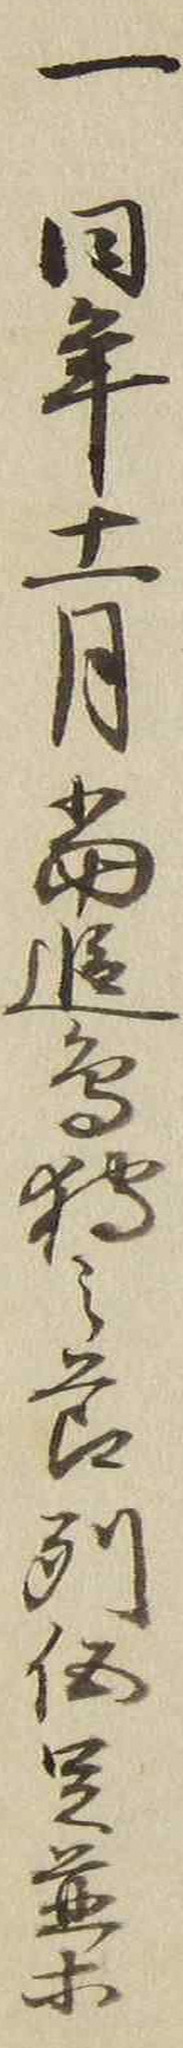一同年十一月当追鳥狩之節列伍足並等

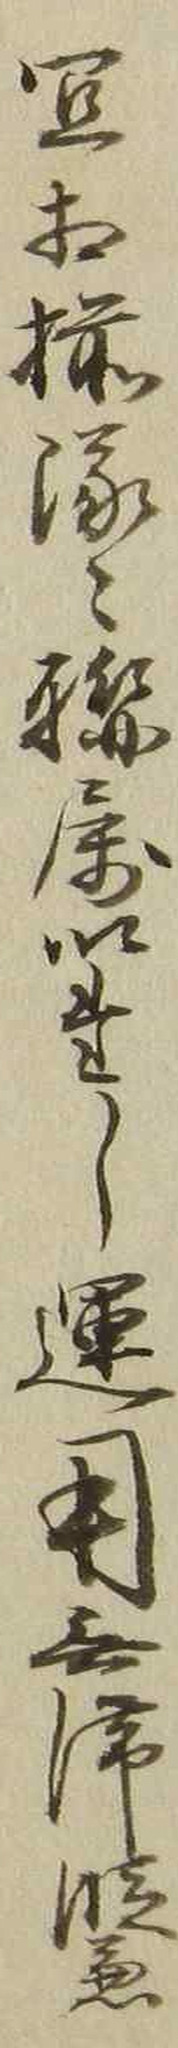宜相揃隊之聯属いたし運用無滞段兼
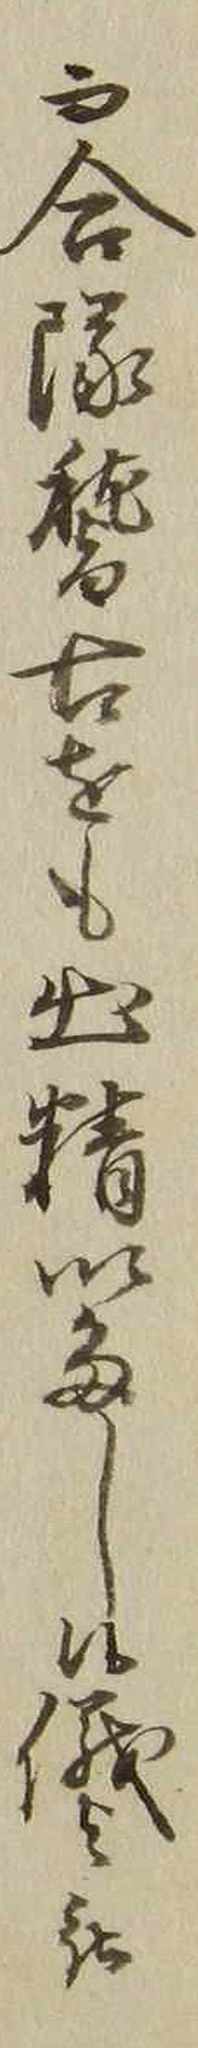而合隊稽古をも出精いたし候儀と被
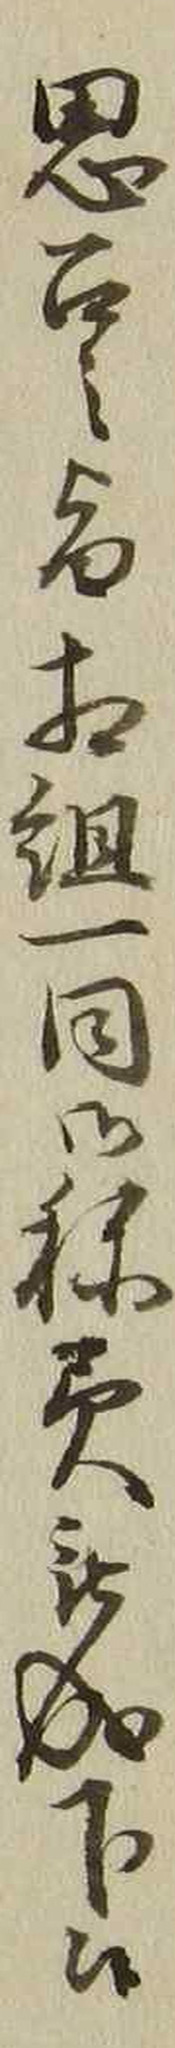思召之旨相組一同御称美被成下候
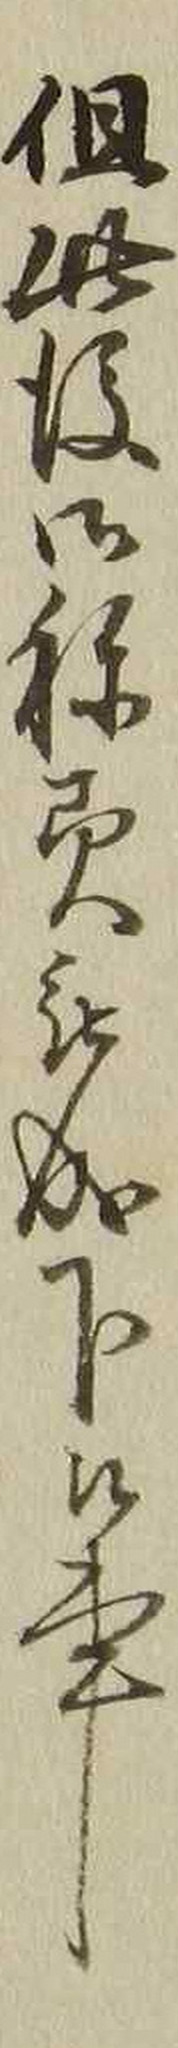但此後御称美被成下候事
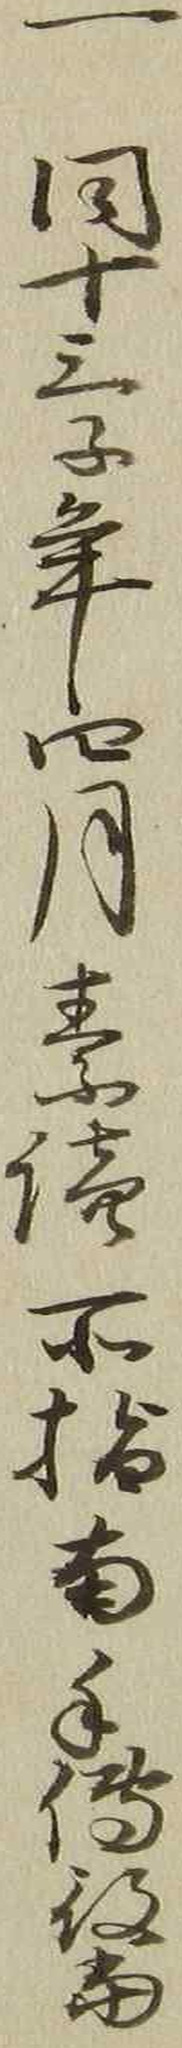一同十三子年四月素読所指南手伝役当
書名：諸士系譜　巻之114　か之部22
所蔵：会津若松市立会津図書館
